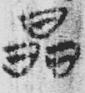晶（三）
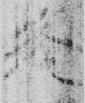帀（師）
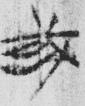或
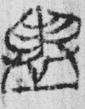○（輿）
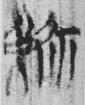○（屍）
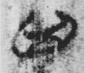凶
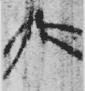六
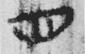四
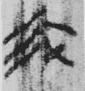帀（師）
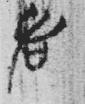左
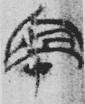○（次）
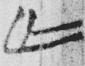亡（无）
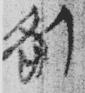咎
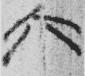六
